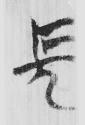長
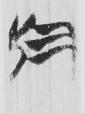於
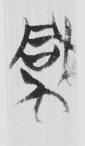風
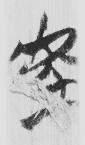𫊟
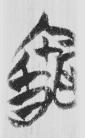{尒䎽}
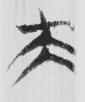夫
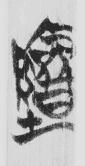險
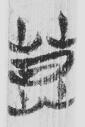莫
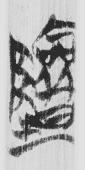險
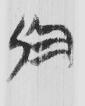於
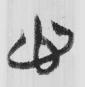心
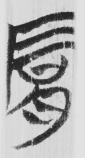{厂肙}
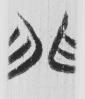非
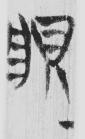{爿貝}
